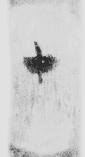十
